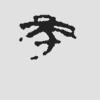帀
